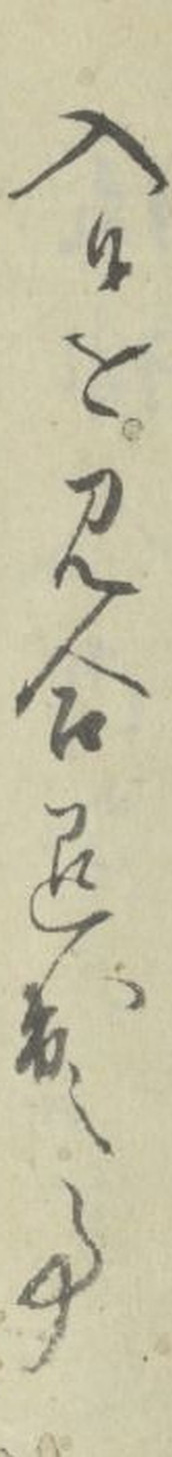入候を見合退出之事
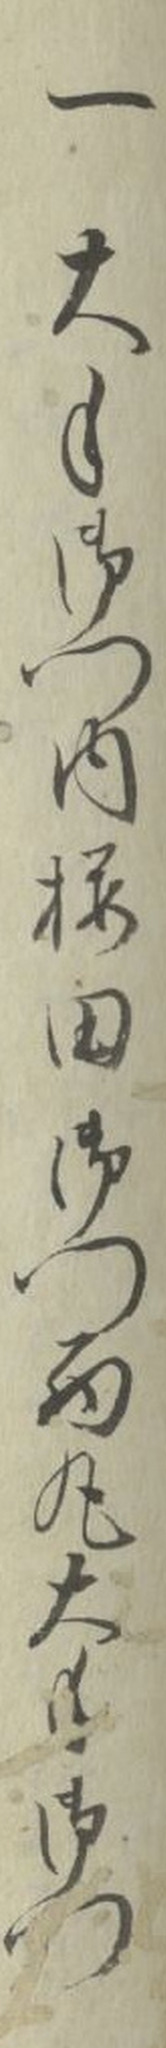一大手御門内桜田御門西丸大手御門
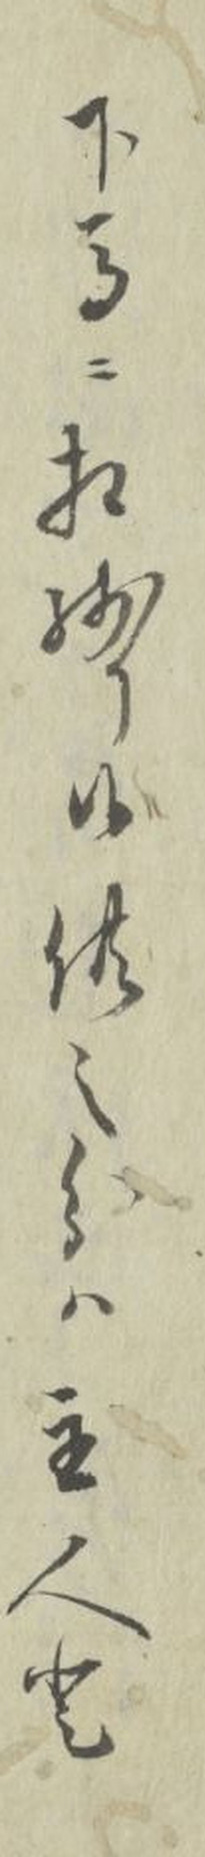下馬に相残り候供之分は主人登
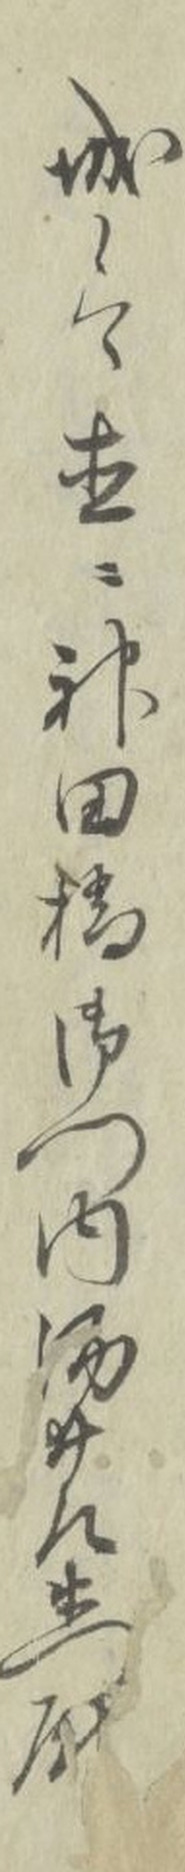城候はゝ直に神田橋御門内酒井左衛門尉
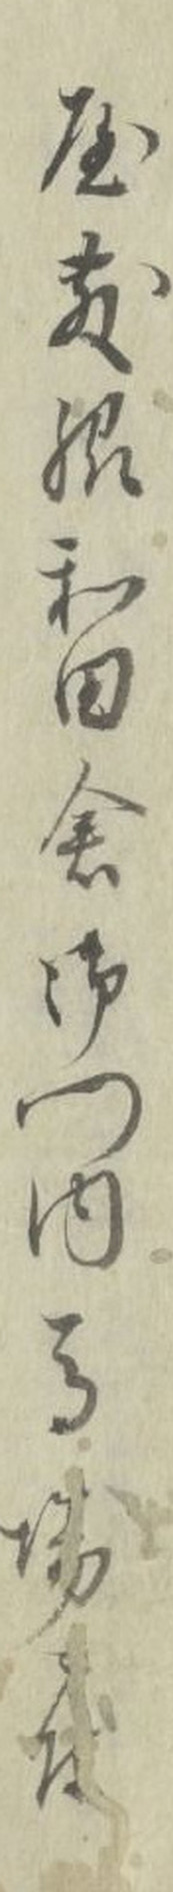屋敷脇和田倉御門内馬場に付
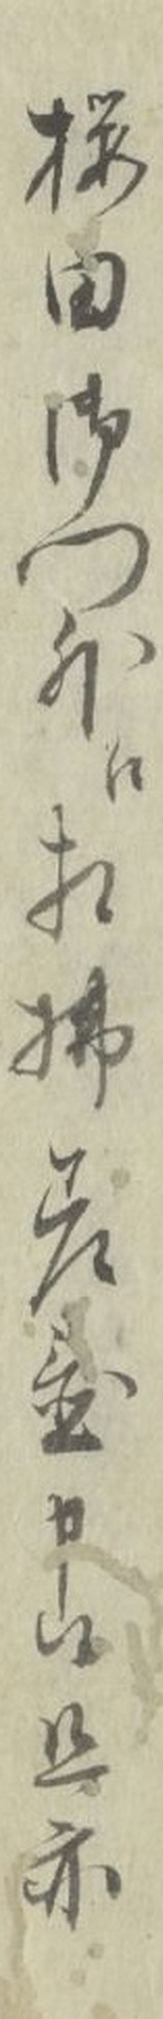桜田御門外え相払差置申候且亦
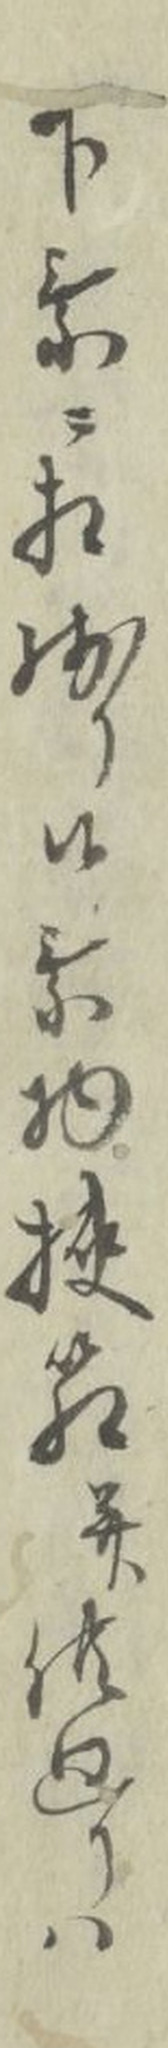下乗に相残り候乗物挟箱幷供廻りは

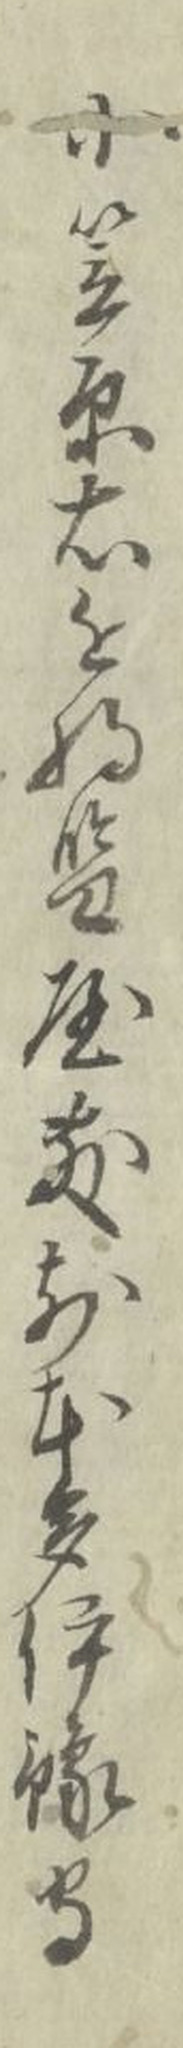小笠原右近将監屋敷前本多伊予守
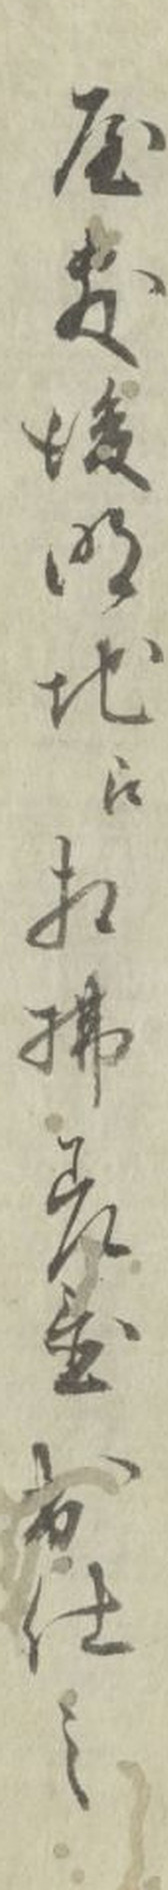屋敷後明地え相払差置出仕之
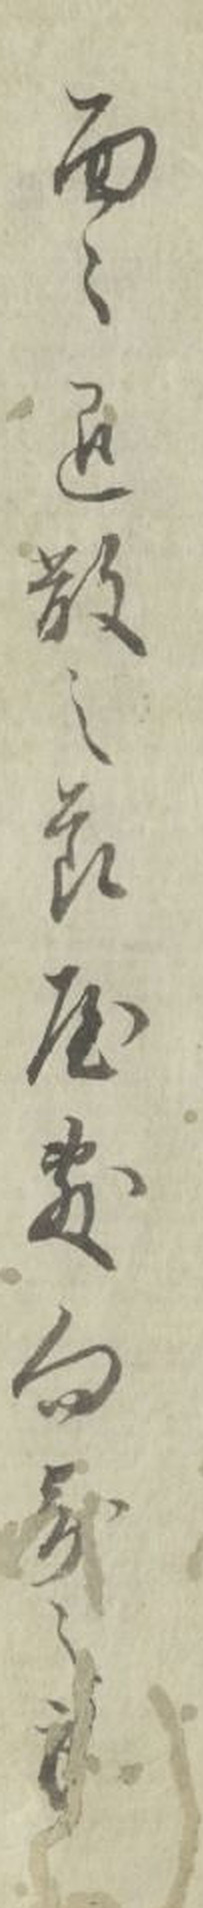面々退散之節屋敷向寄之方
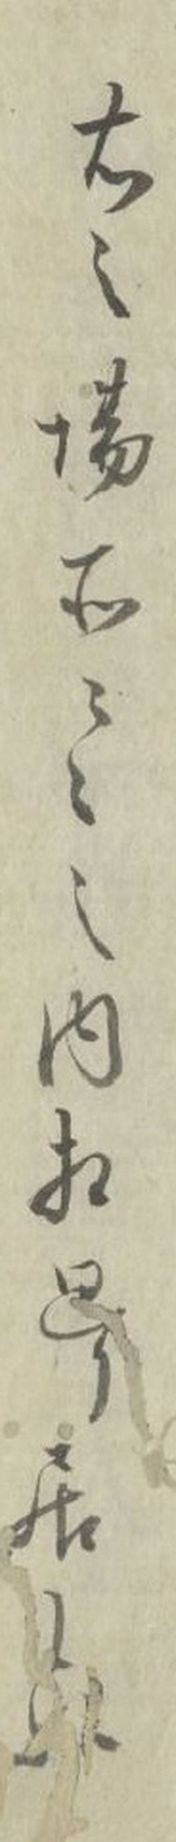右之場所々々之内相廻り居候様
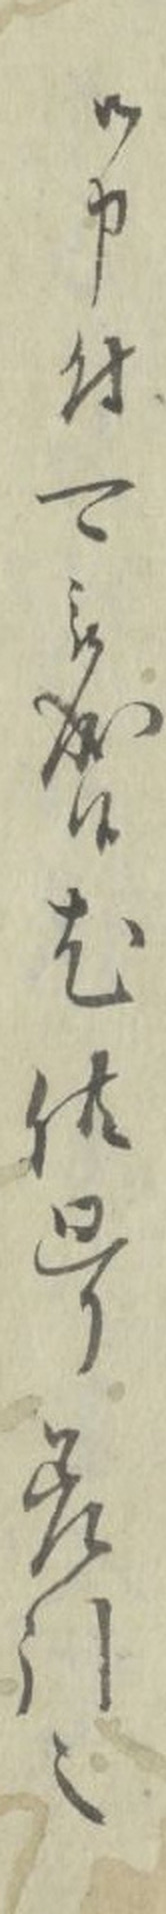御申付可被成候尤供廻り差引之
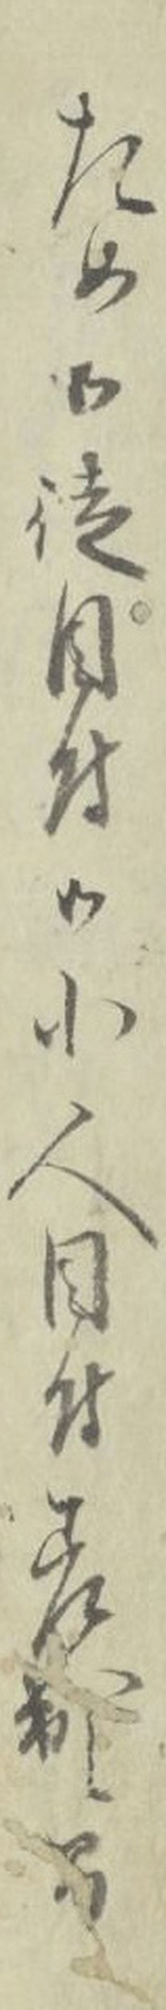ため御徒目付御小人目付差出候間
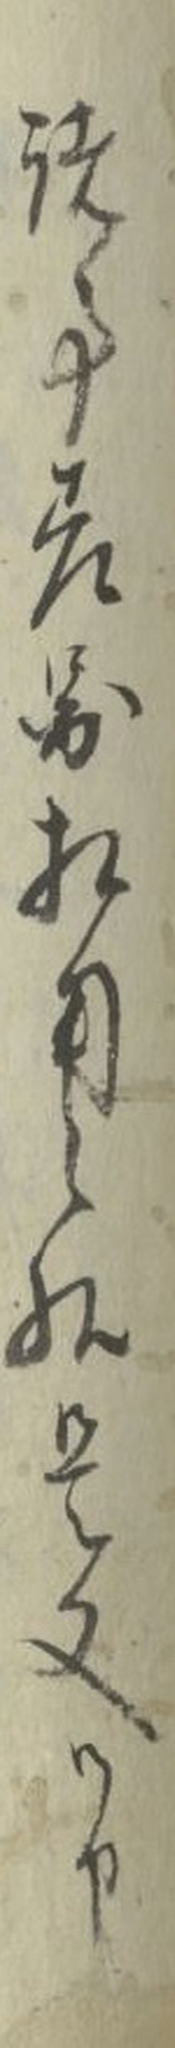諸事差図相用候様是又御申
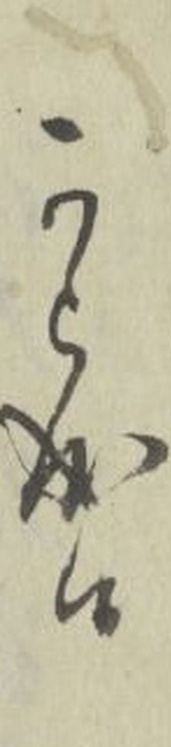可被成候
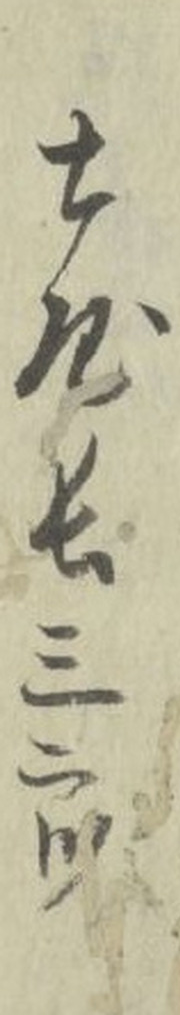土屋長三郎
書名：琉球来朝記 自一至七
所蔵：University of the Ryukyus Library
